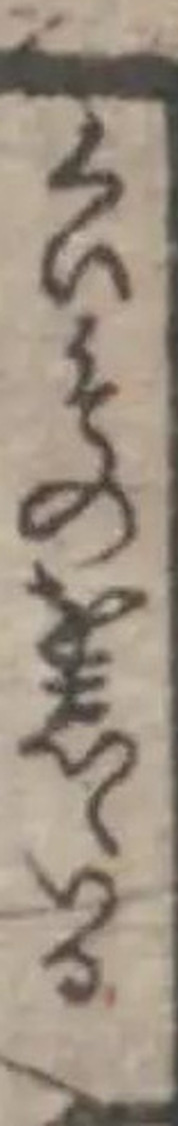くいものをしゝいる
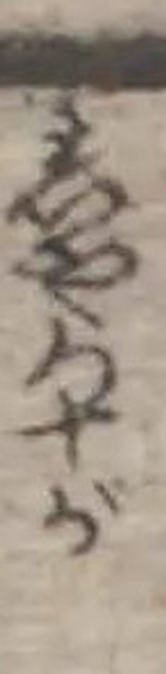しやか十が
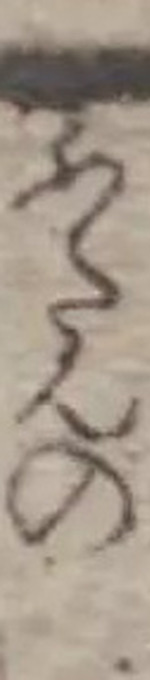ふたんの
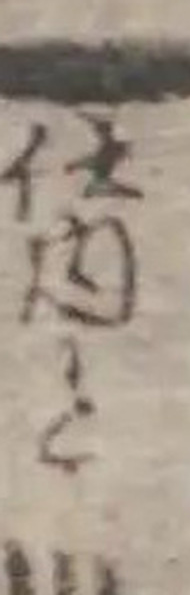仕内と
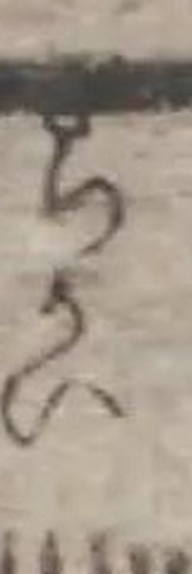ちかい
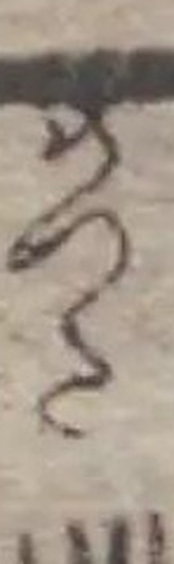めつた
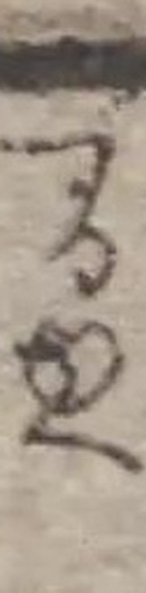するゆへ
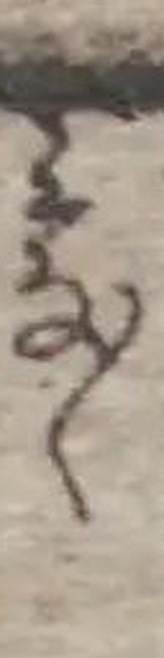みな〳〵
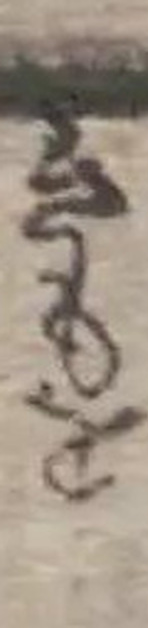きもを
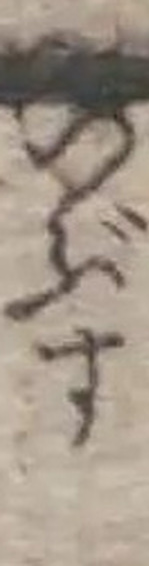つぶす

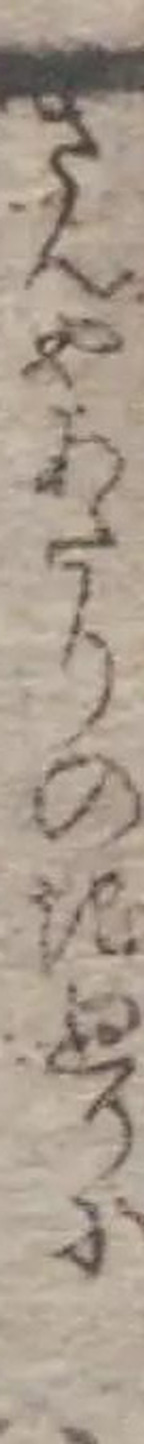さんやあたりの地廻りに
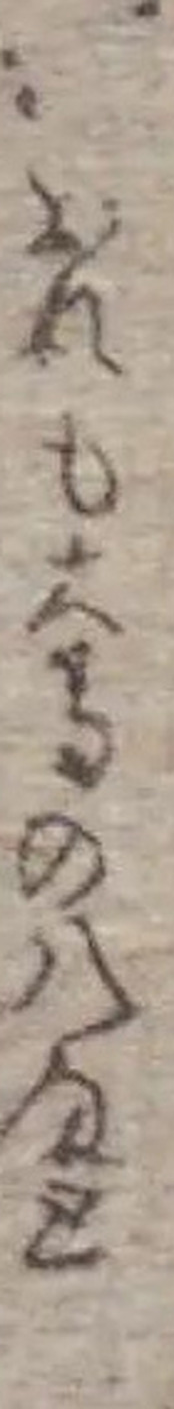おれも大間の八様と
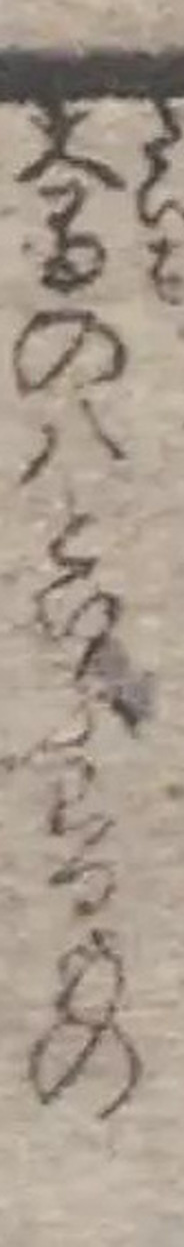大間の八といふわるもの
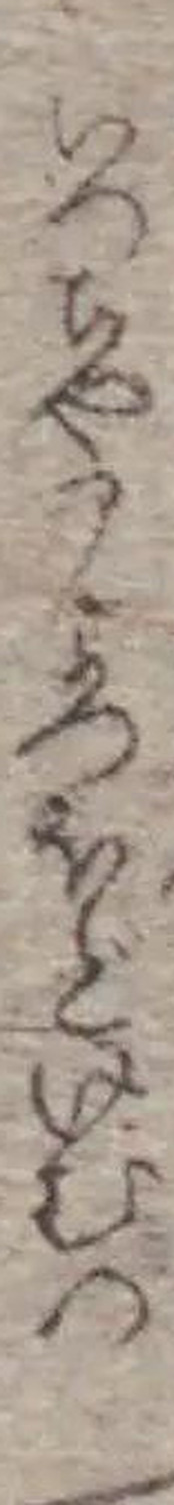いつちやアよつほどけむつ
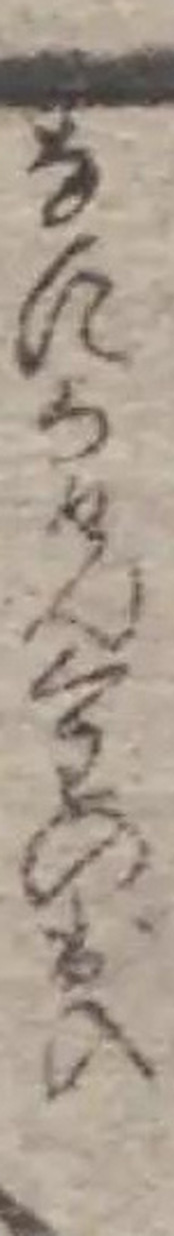なにかけんくわの出入
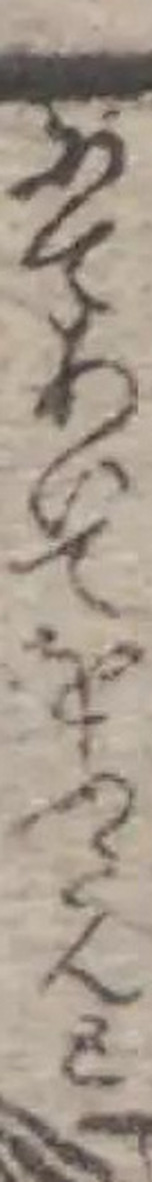にてあいてをぶたんと
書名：早出来 3巻
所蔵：国立国会図書館 National Diet Library, JAPAN
